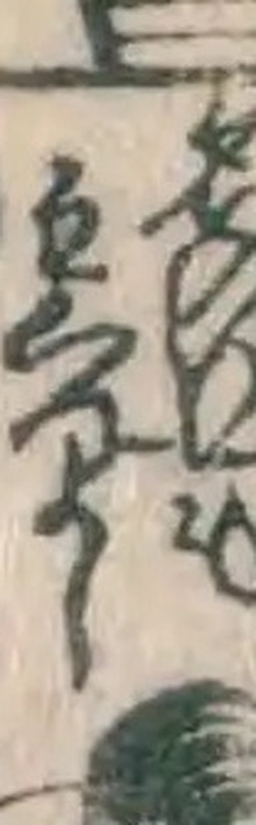主くんよし
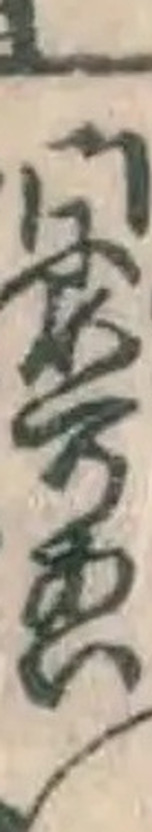門にめくりあい
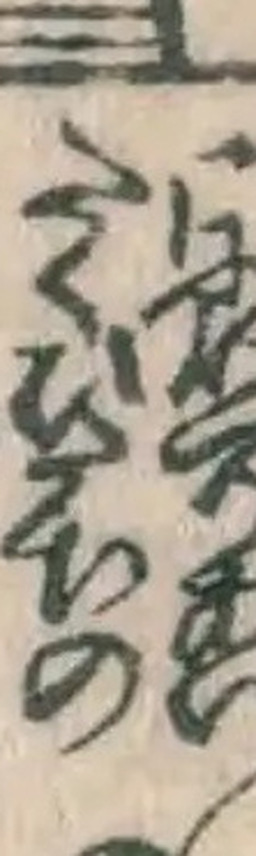たくひたちの
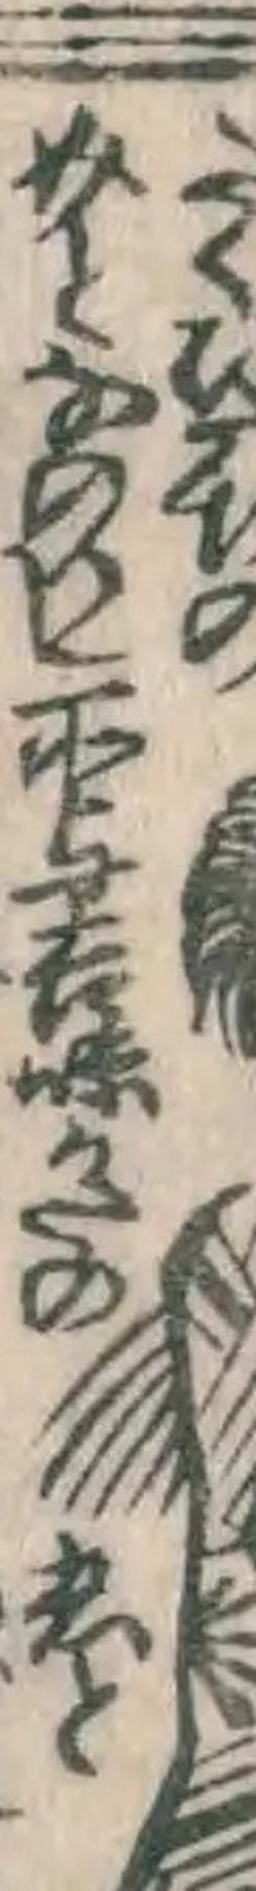介となのりし所与吉妹かたのゑと
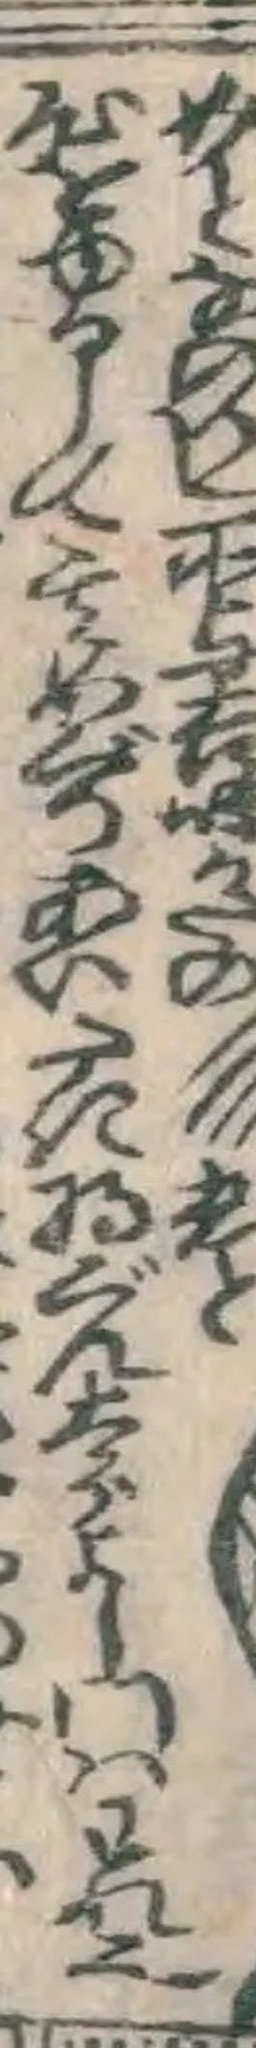心をゆるして其めぐりあいたき将ぐん太郎よし門はわれ也
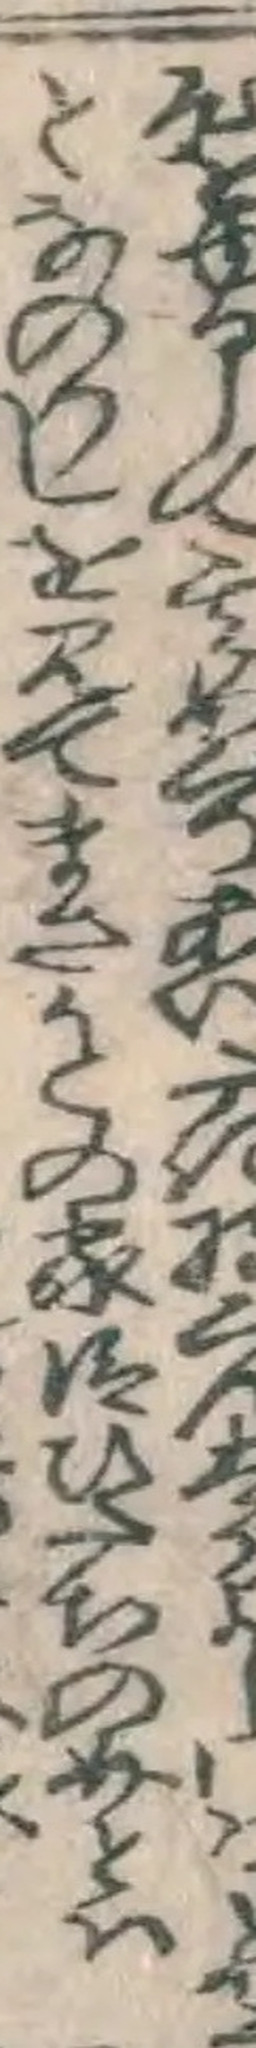となのりしを見てまさかとの家臣ひたちの介とは
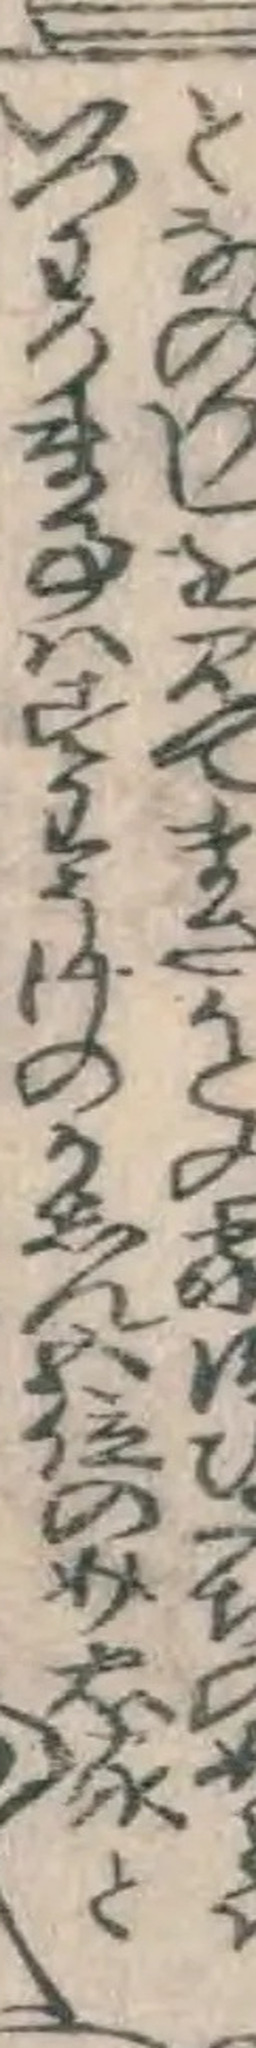いつわりま事はすわうけのかしん五位の介忠家と
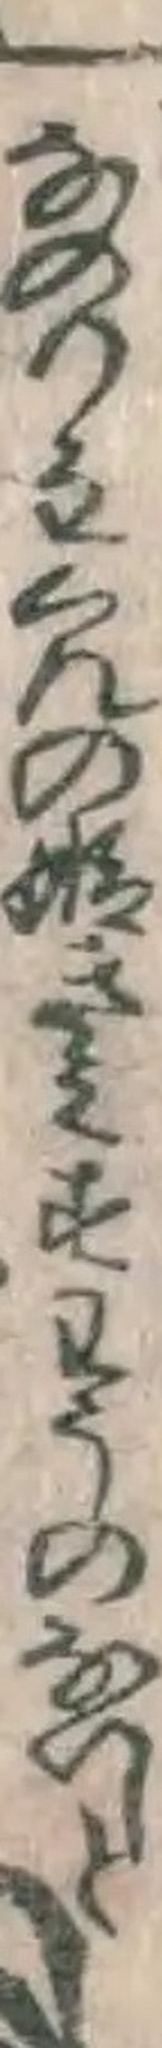なのり主くんの姫きみすわうのないしと
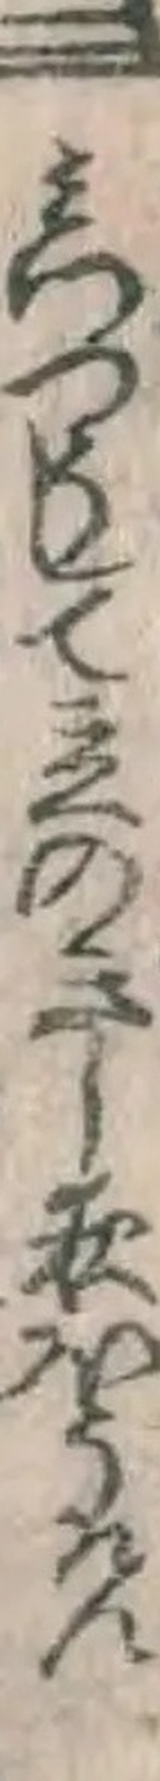みつつうして立のきし夜ほうけん
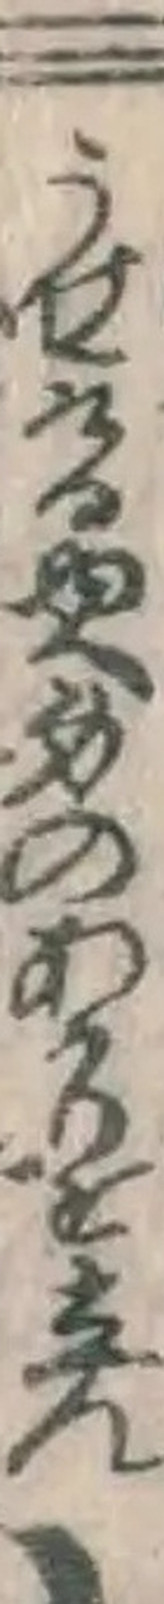うせけるゆへ身のあかりを立ん
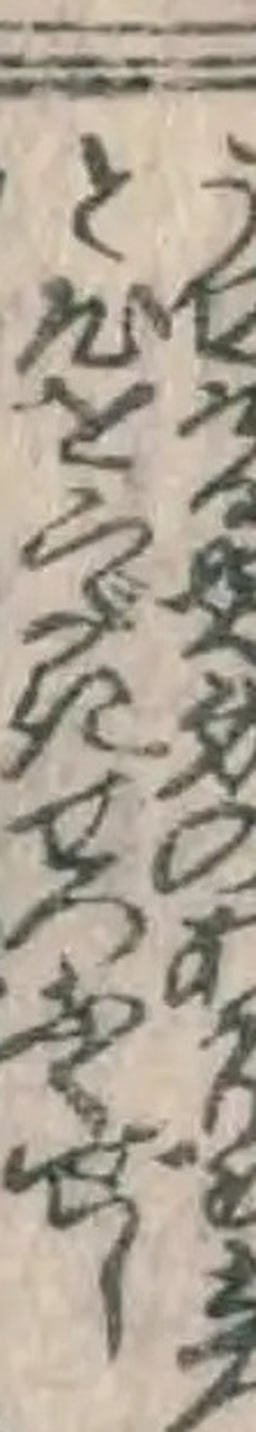と心をくだきせつふくぜし
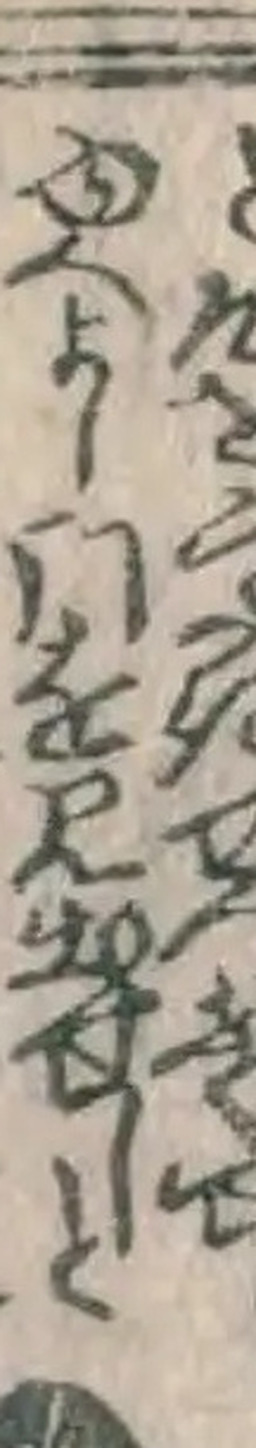ゆへよし門を見出せしと
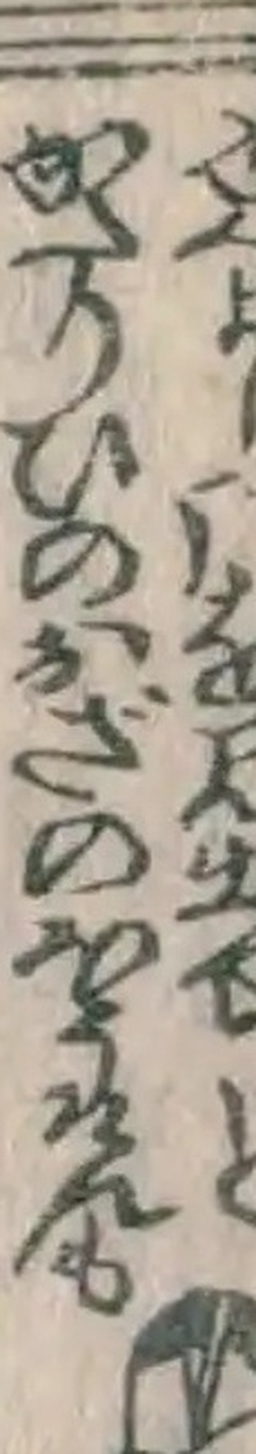かたりひのおざのほうけんも
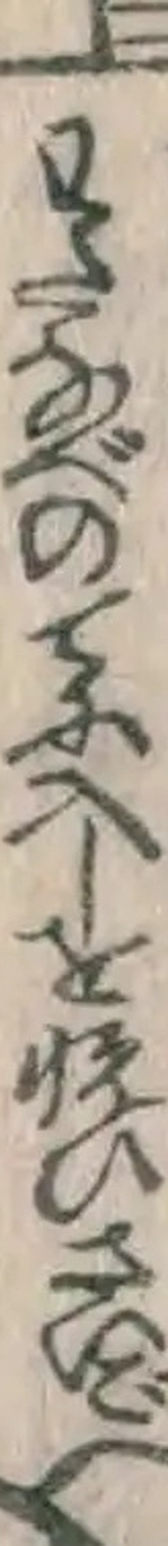わたなべのてに入しを悦ひさいご
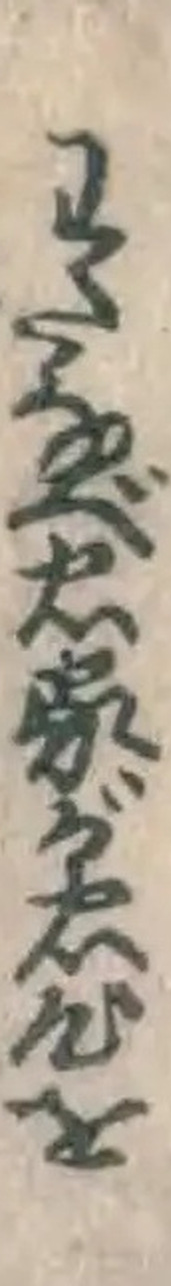わたなべ忠家が忠心を
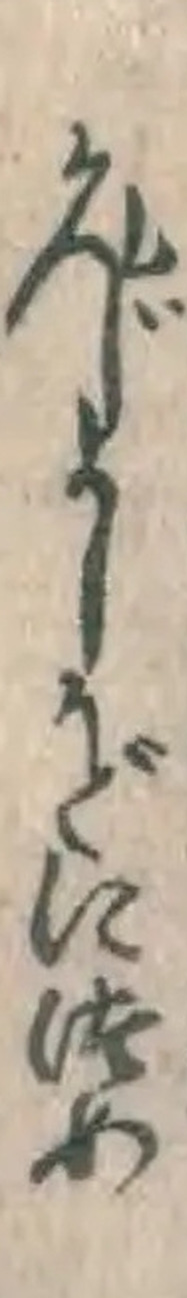かんじよしかどにつめ
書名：四天王宿直着綿
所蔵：国立国会図書館 National Diet Library, JAPAN
